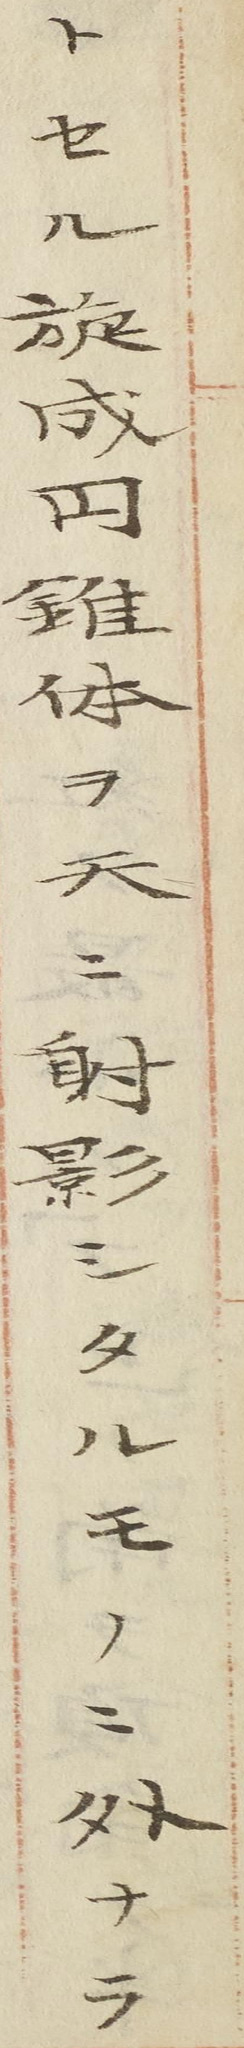トセル旋成円錘体ヲ天ニ射影シタルモノニ外ナラ
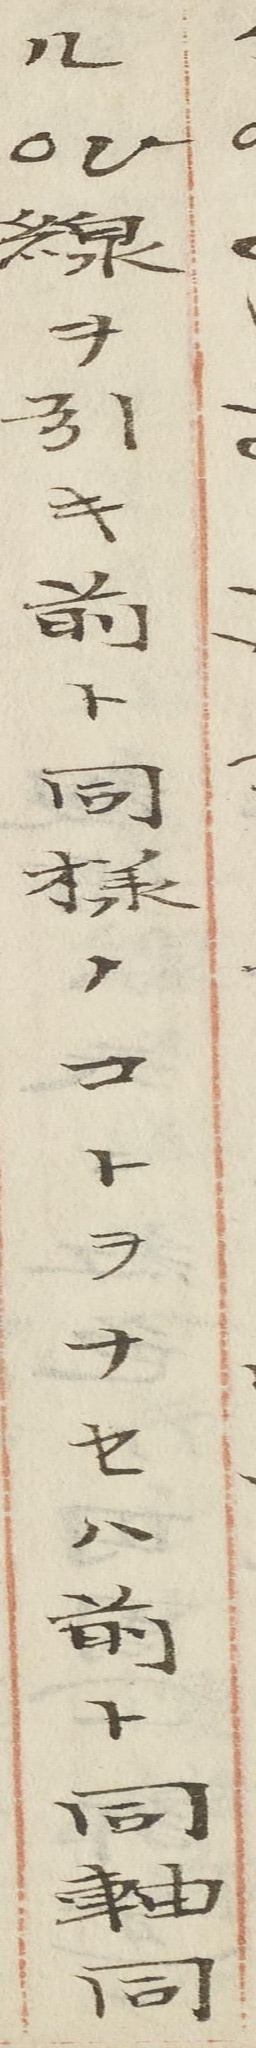ルｏｖ線ヲ引キ前ト同様ノコトヲナセハ前ト同軸同
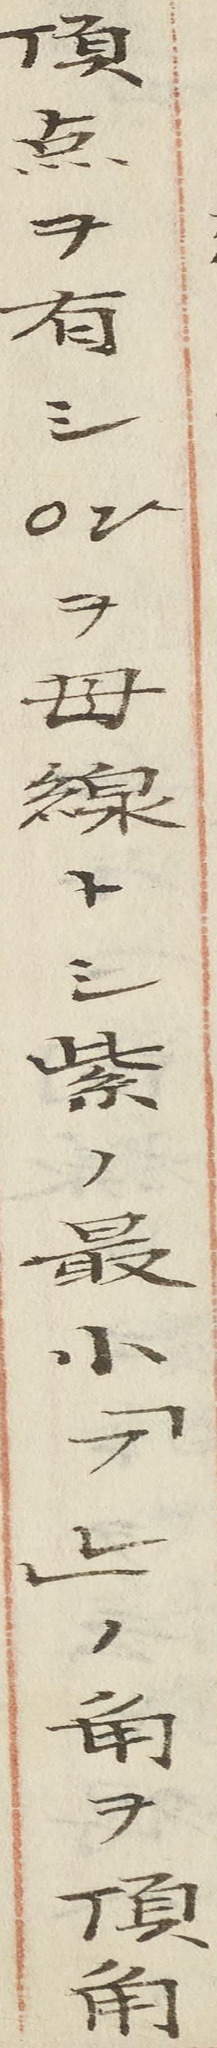頂点ヲ有シｏｖヲ母線トシ紫ノ最小「フレ」ノ角ヲ頂角
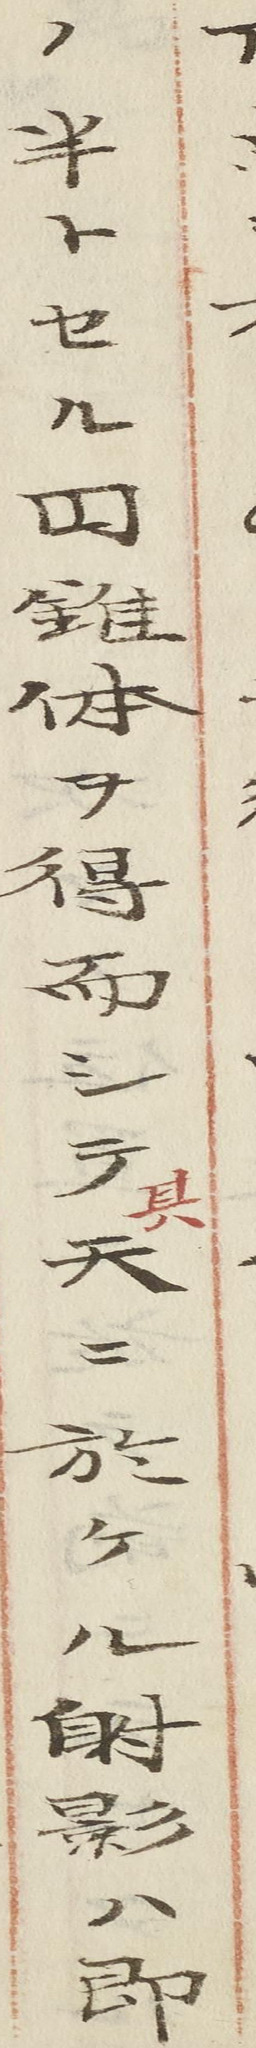ノ半トセル円錐体ヲ得而シテ其天ニ於ケル射影ハ即
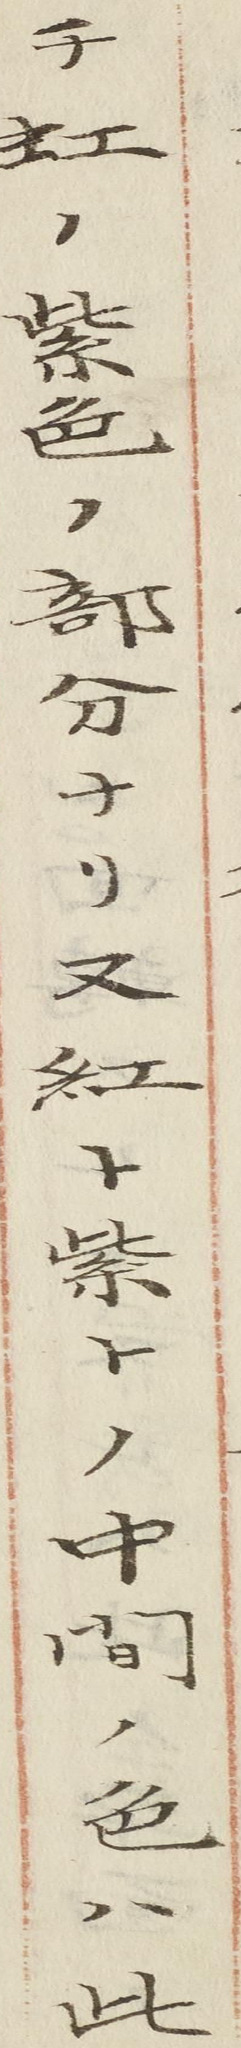チ虹ノ紫色ノ部分ナリ又紅ト紫トノ中間ノ色ハ此
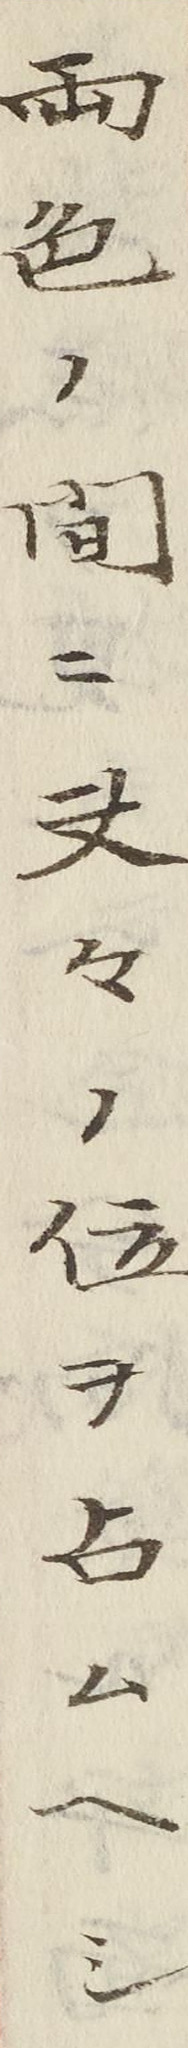両色ノ間ニ夫々ノ位ヲ占ムヘシ
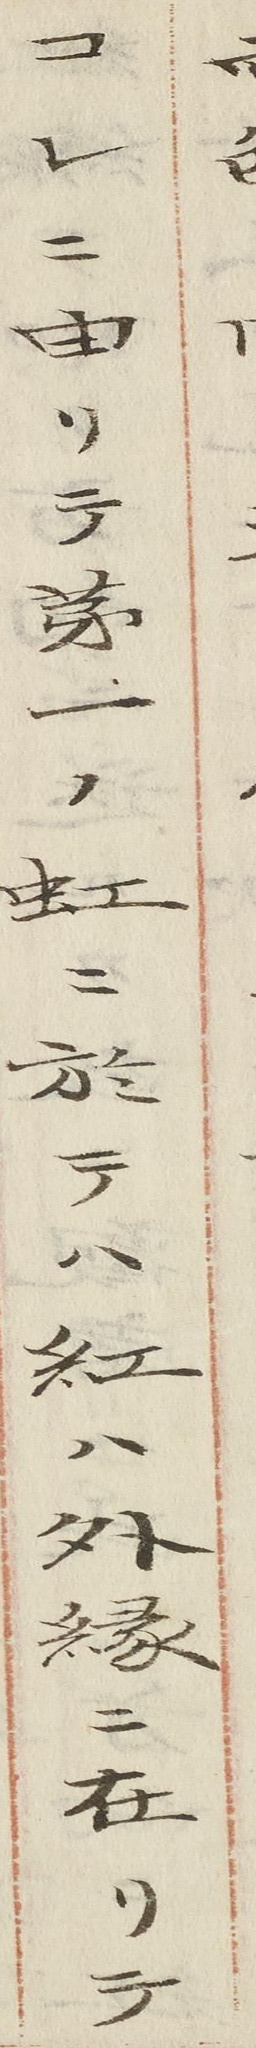コレニ由ロテ第一ノ虹ニ於テハ紅ハ外縁ニ在リテ
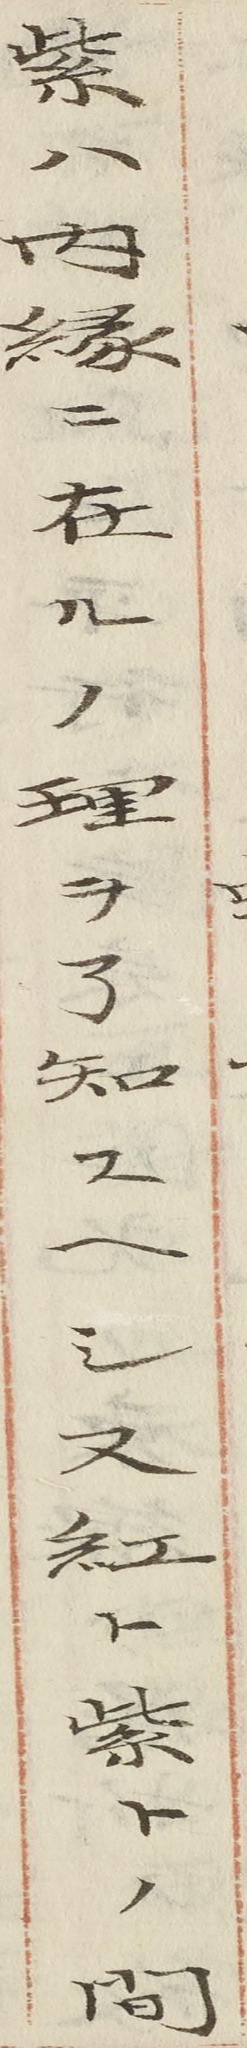紫ハ内縁ニ在ルノ理ヲ了知スヘシ又紅ト紫トノ間
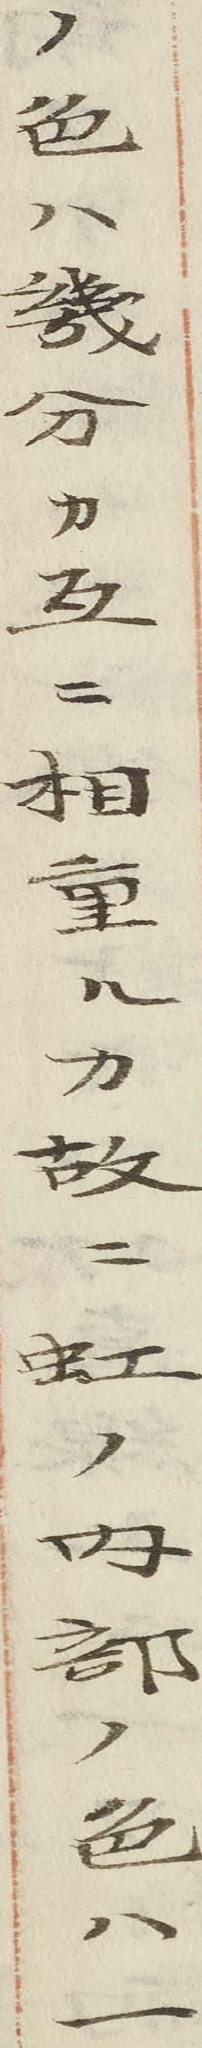ノ色ハ幾分カ互ニ相重ルカ故ニ虹ノ内部ノ色ハ一
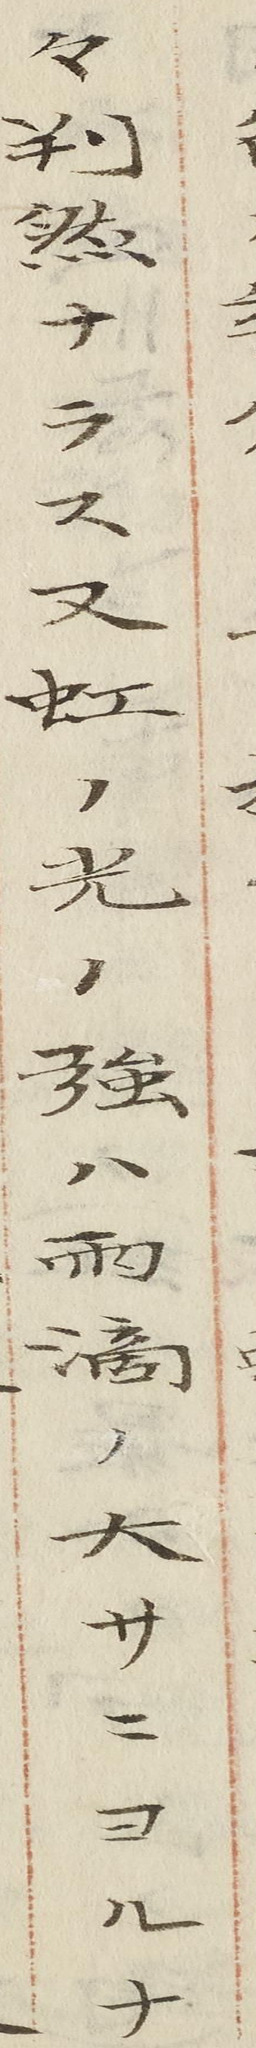々判然ナラス又虹ノ光ノ強ハ雨滴ノ大サニヨルナ
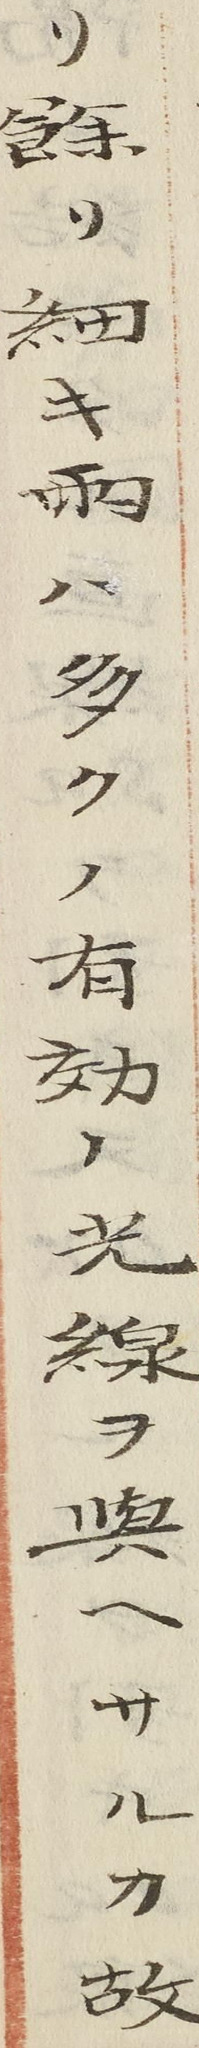リ余リ細キ雨ハ多クノ有効ノ光線ヲ与ヘサルカ故
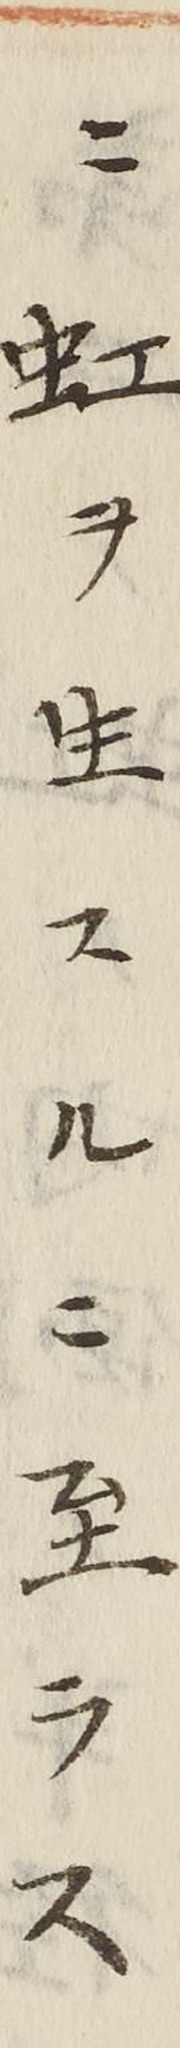ニ虹ヲ生スルニ至ラス
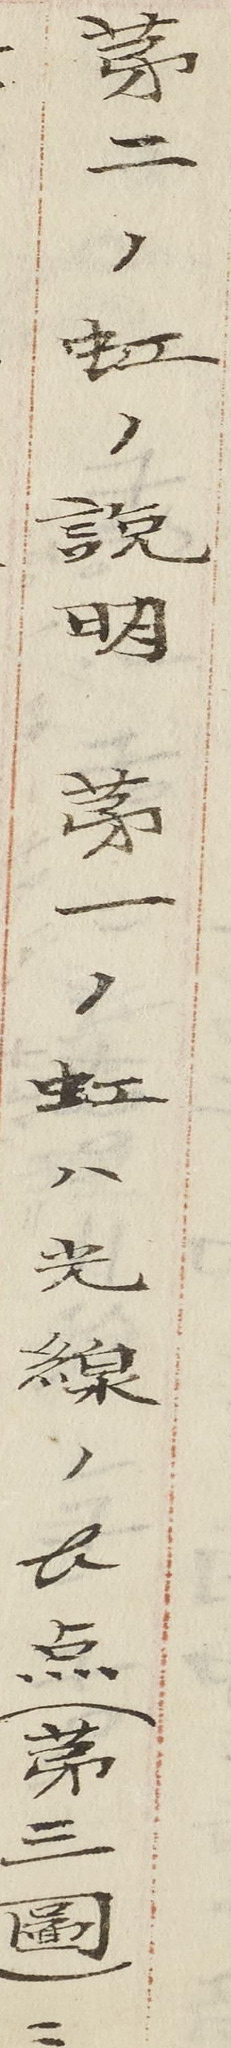第二ノ虹ノ説明第一ノ虹ハ光線ノｂ点ニ
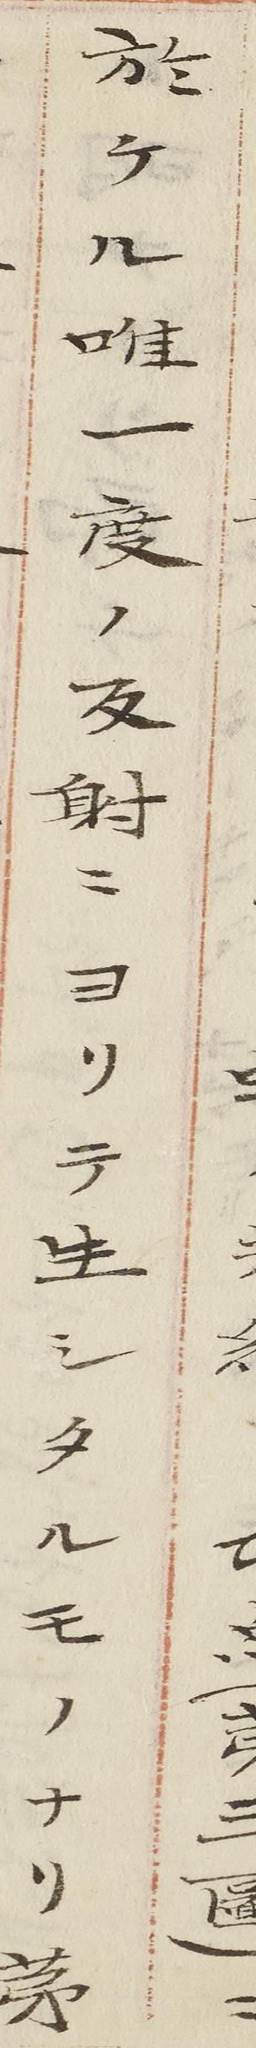於ケル唯一度ノ反射ニヨリテ生シタルモノナリ第
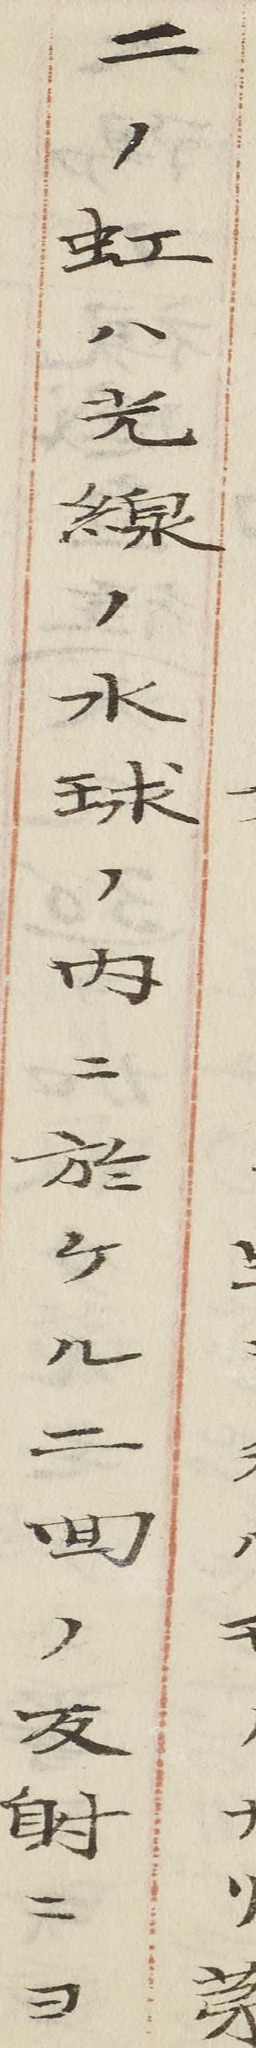ニノ虹ハ光線ノ水球ノ内ニ於ケルニ回ノ反射ニヨ
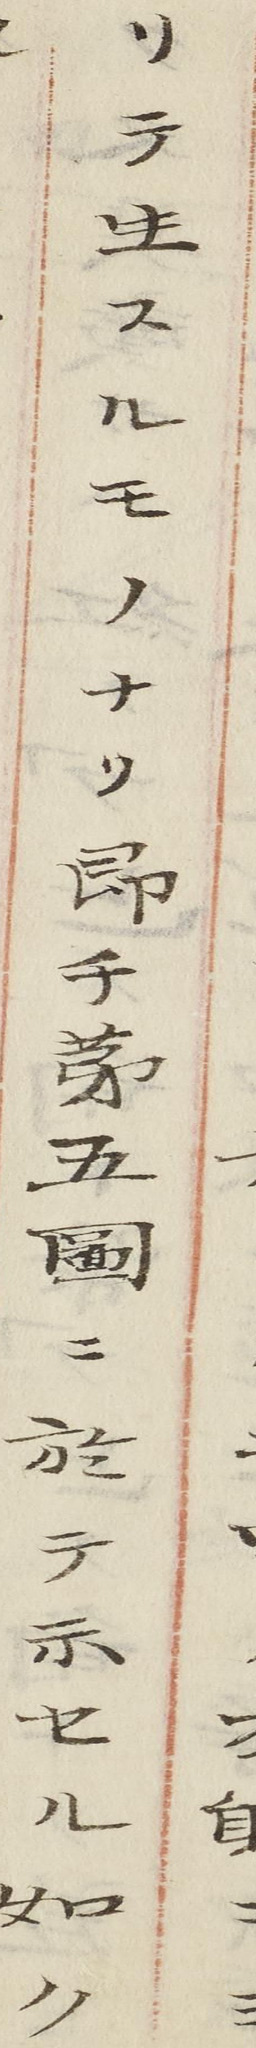リテ生スルモノナリ即チ第五図ニ於テ示セル如ク
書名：虹及ハロノ説明
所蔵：東京大学地震研究所図書室 Earthquake Research Institute Library, The University of Tokyo, JAPAN
